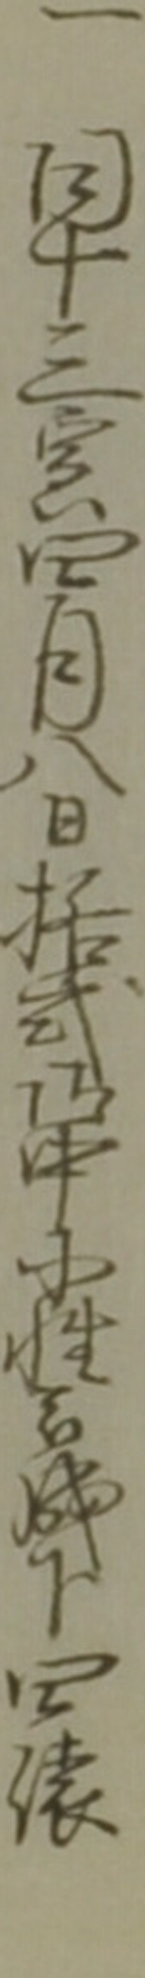一同十三寅四月八日格式御中小性被成下四俵
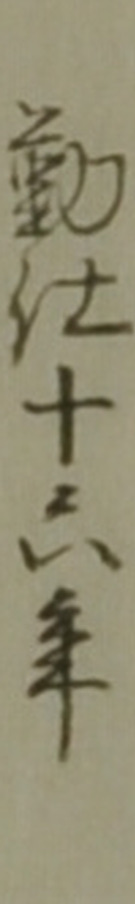勤仕十六年
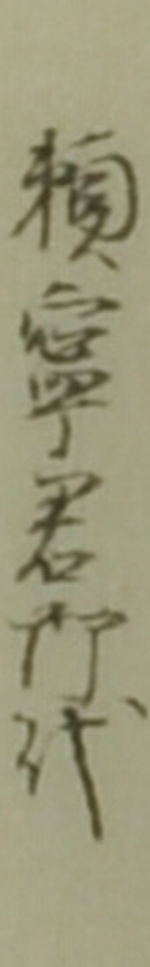頼寧君御代

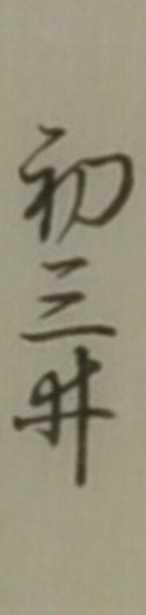初三井
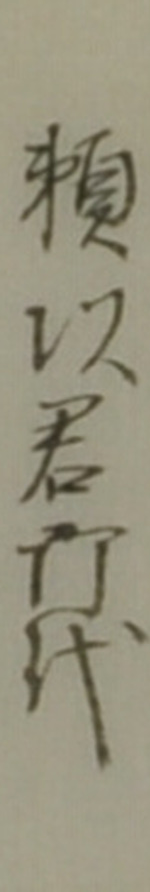頼以君御代
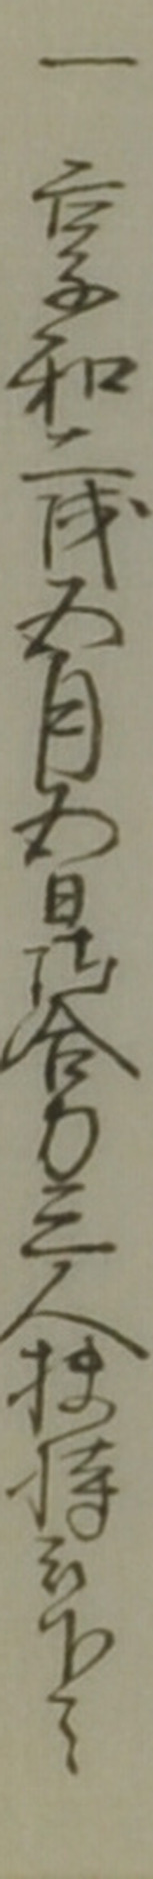一享和ニ戌五月五日御合力三人扶持被下之
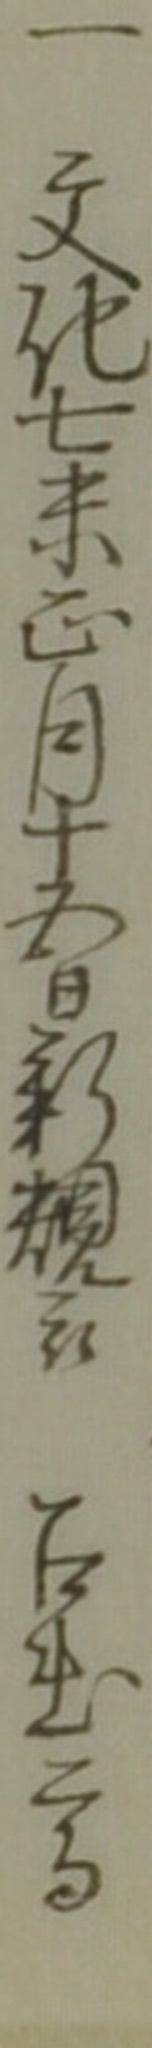一文化七未正月十五日新規被召出高
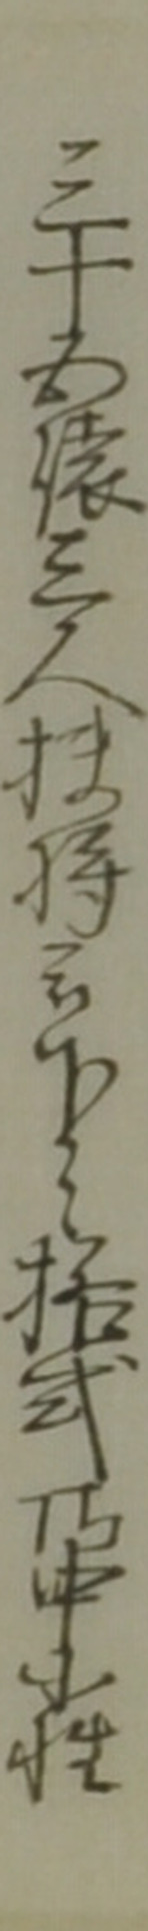三十五俵三人扶持被下之格式御中小性
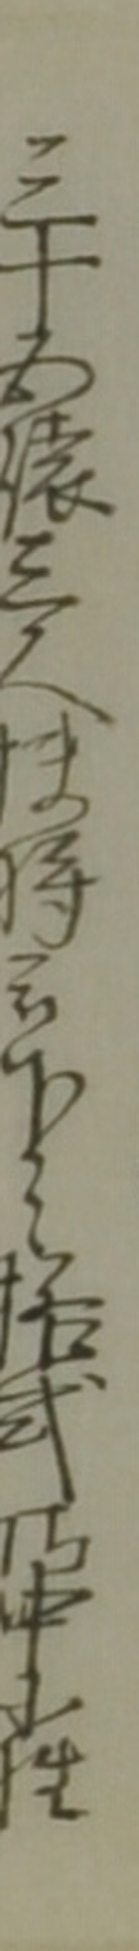三十五俵三人扶持被下之格式御中小性
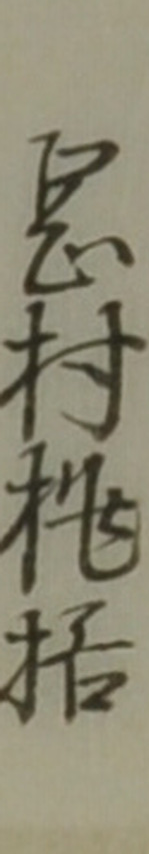岡村桃格

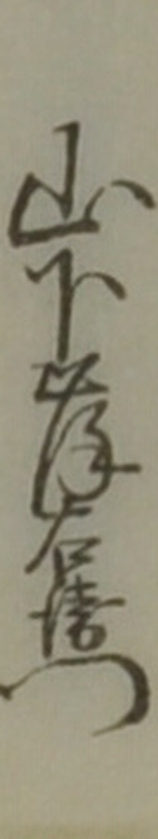山下峯右衛門
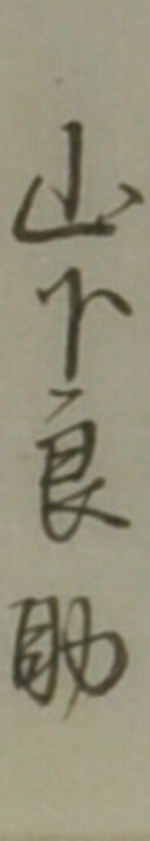山下良助

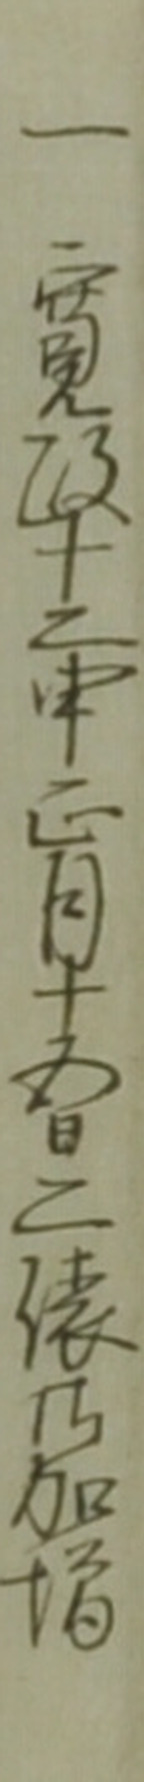一寛政十二申正月十五日二俵御加増
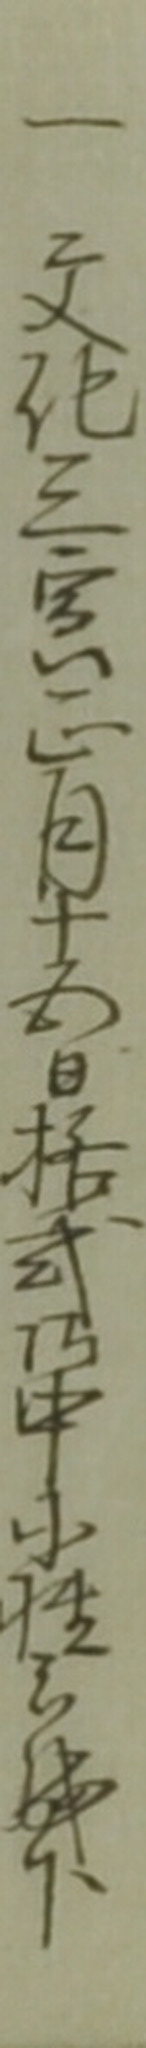一文化三寅正月十五日格式御中小性被成下
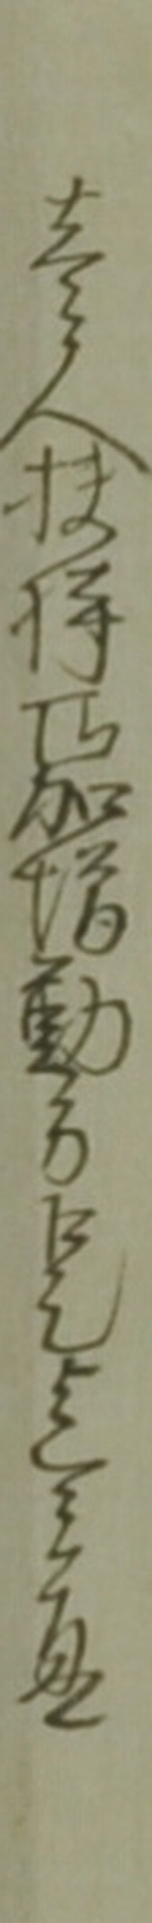壱人扶持御加増勤方是迄之通
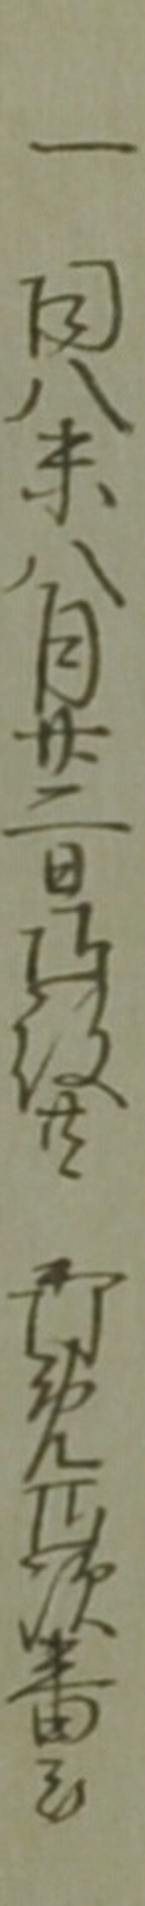一同八未八月廿二日御役共御免御次番被
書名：無足諸士勤仕録（二）
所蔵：伊那市立高遠町図書館・合同会社AMANE
